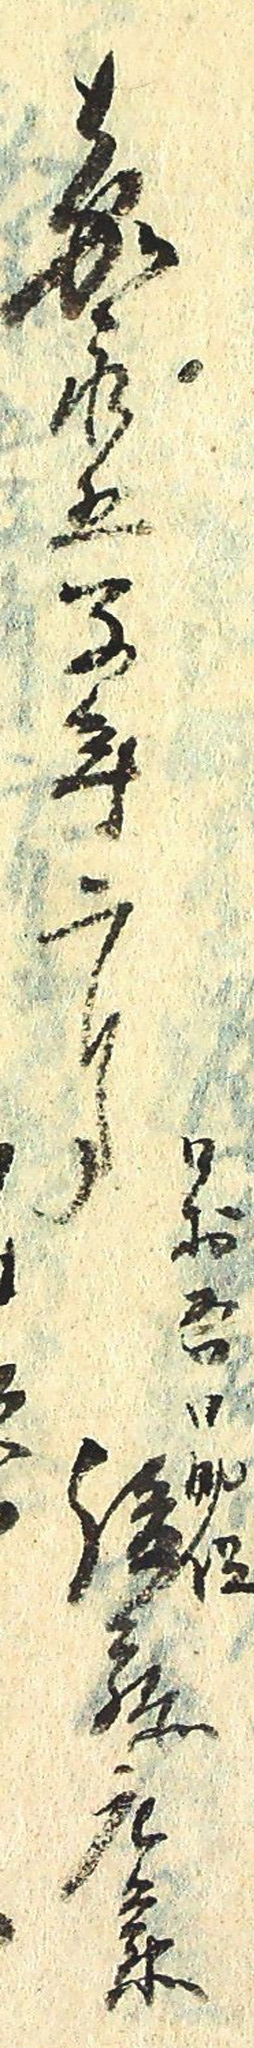嘉永五子年二月後藤庄兵衛
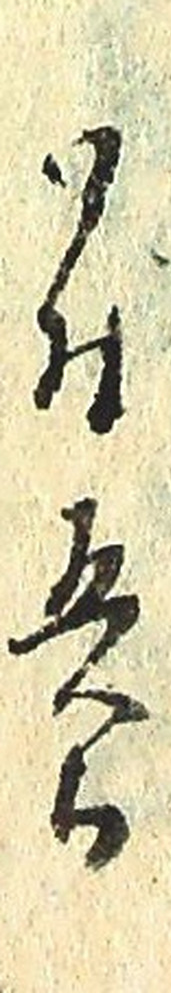同村五人与
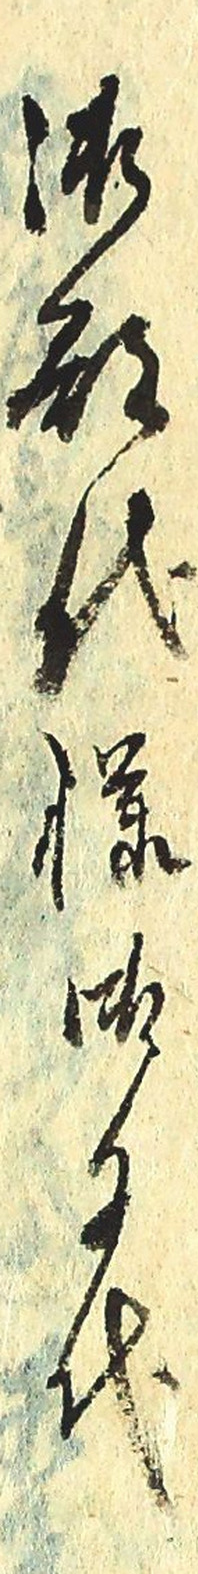御郡代様御手代
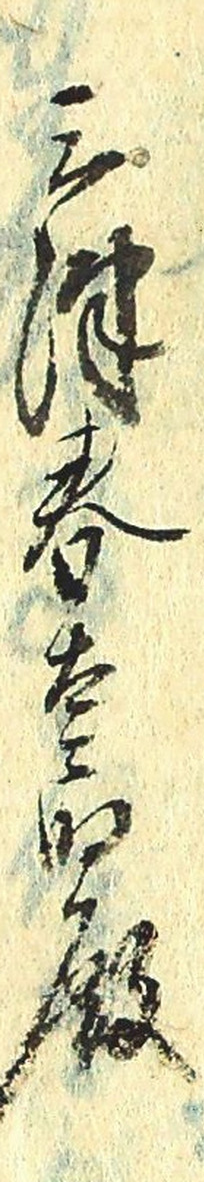三沢春太郎殿
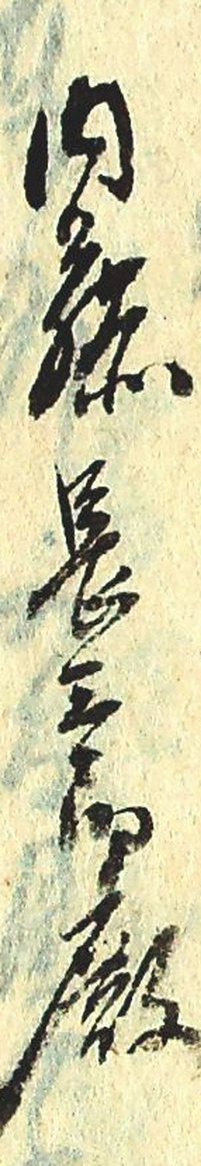内藤長三郎殿
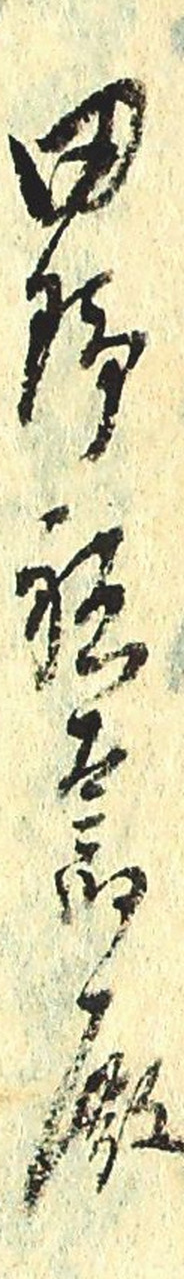田野祐太郎殿
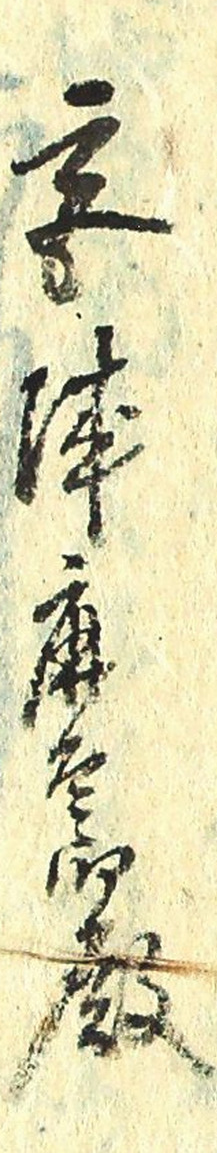宮城麻太郎殿
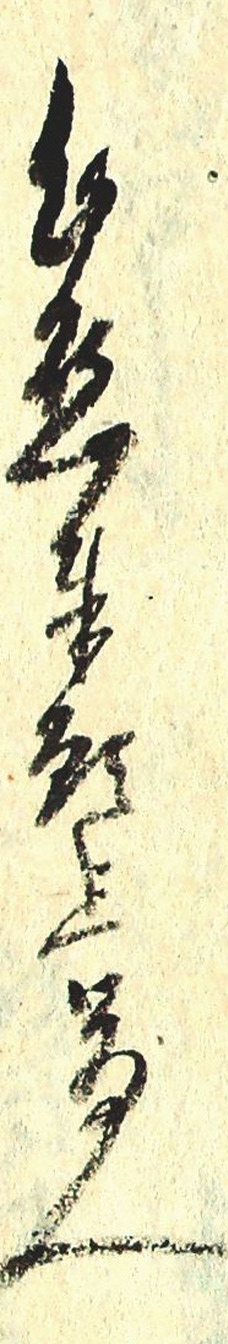乍恐奉願上覚
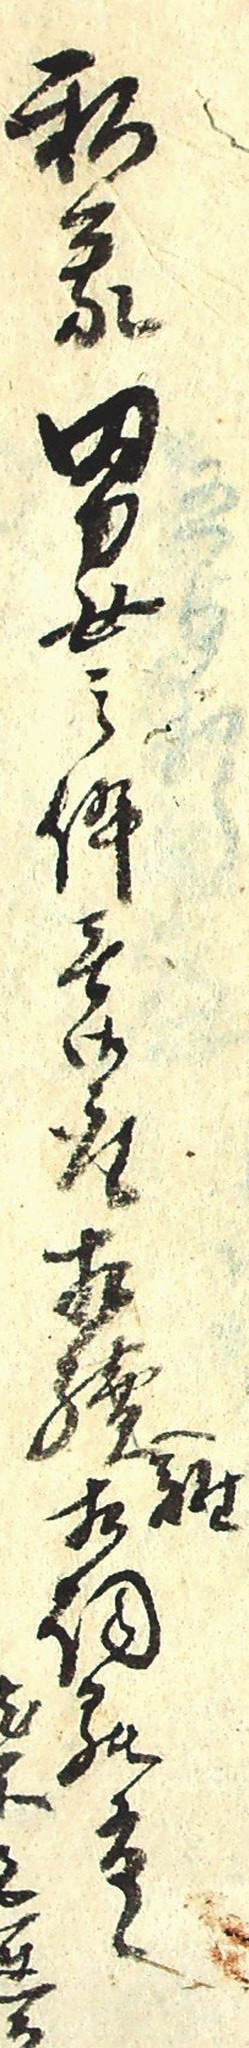私義男女之倅無御座相続難相調罷有候
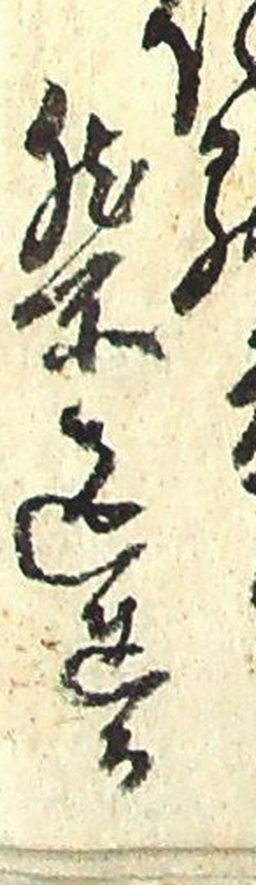然所先達て

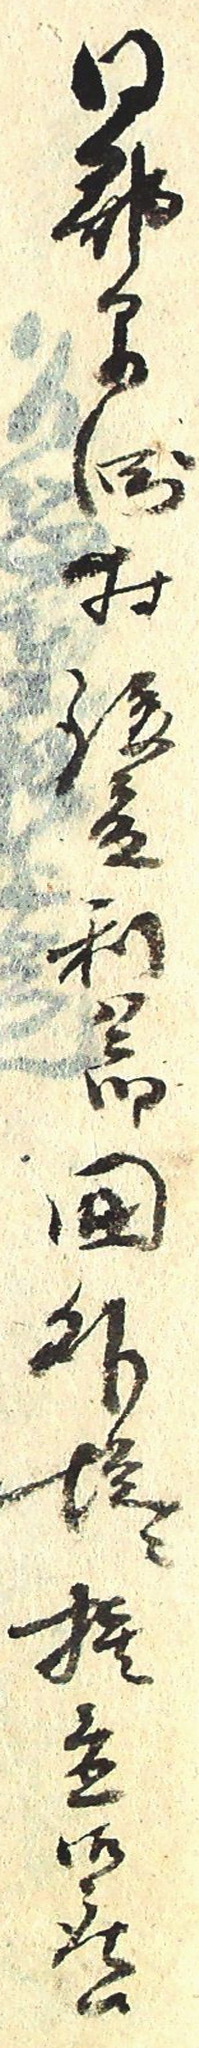同郡早淵村後藤利八郎囲外堤に捨置御座候
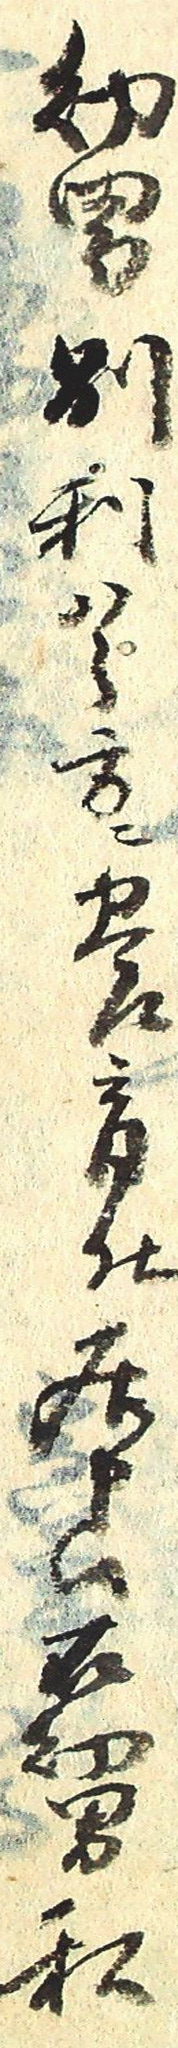幼男則利八郎方に養育仕居申候右幼男私
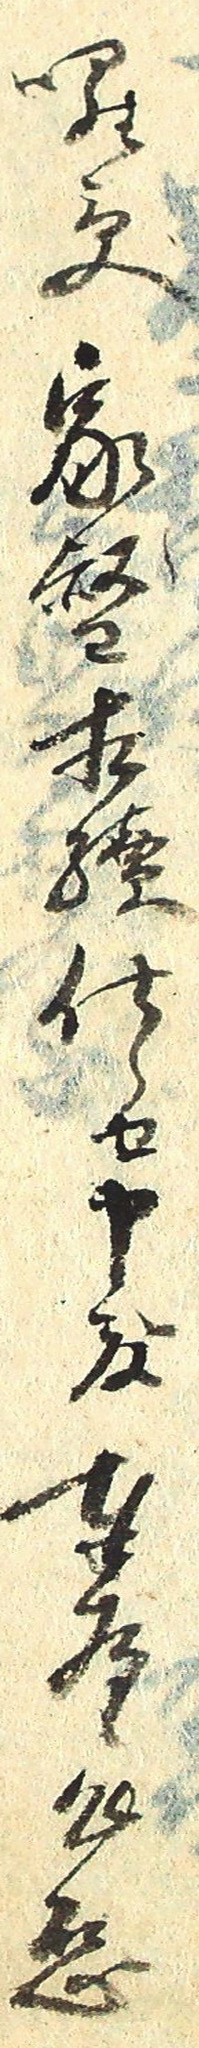囉受家督相続仕らせ申度奉存候乍恐
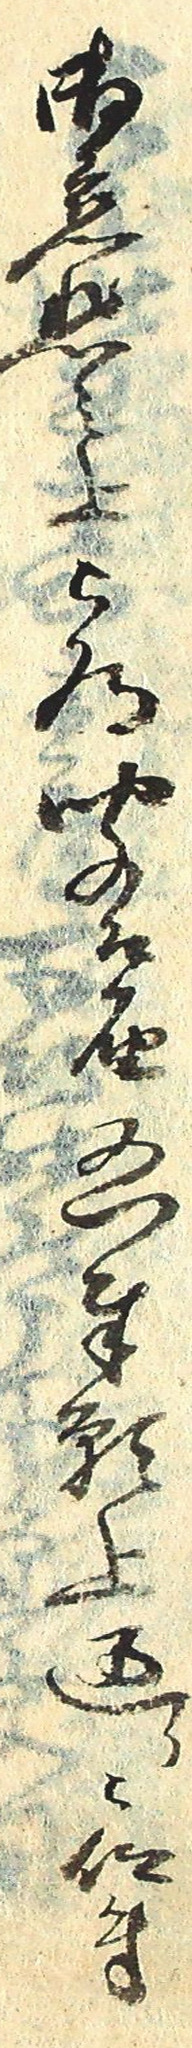御慈悲之上被為聞召届右奉願上通り被仰付
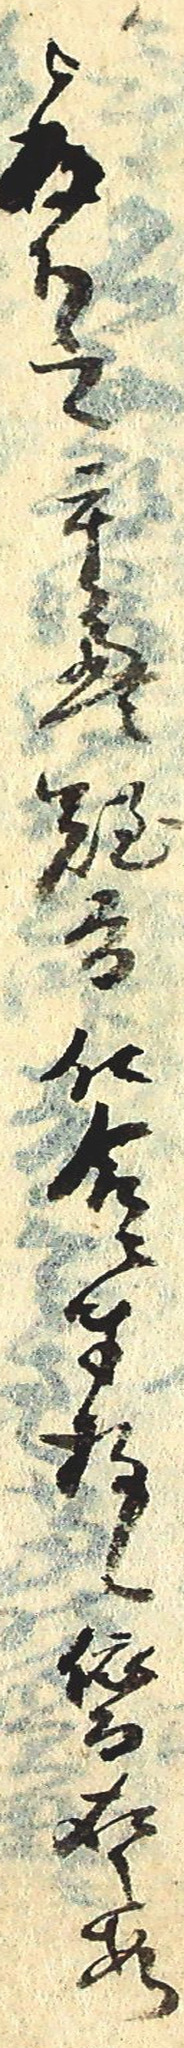被為下候はゝ重畳難有仕合に奉存候依て右之段
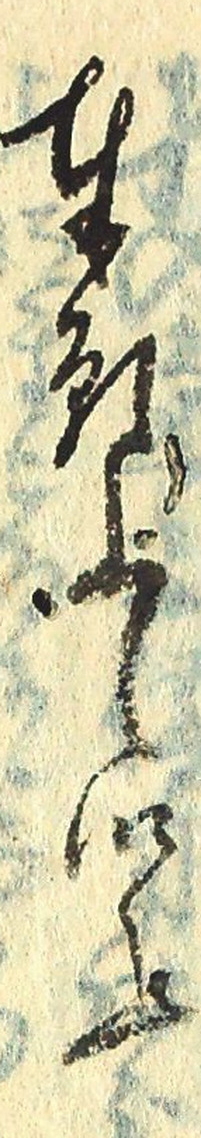奉願上候以上
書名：諸御願書控(弐番）
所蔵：鳴門教育大学 Naruto University of Education
